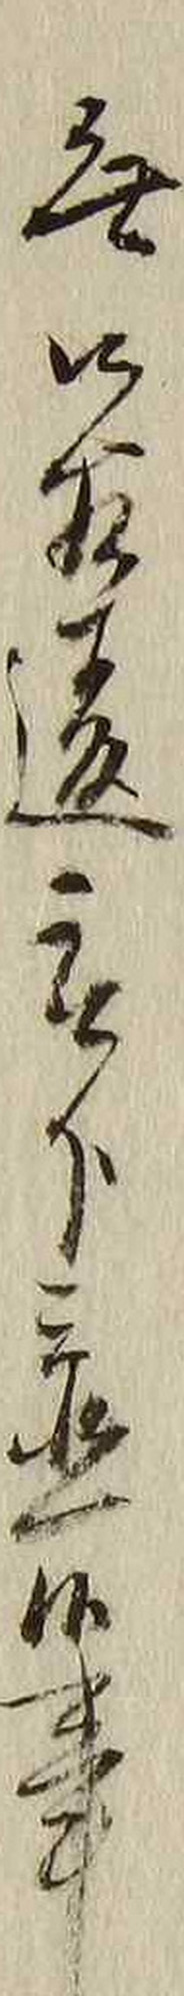無御相違被下置候事
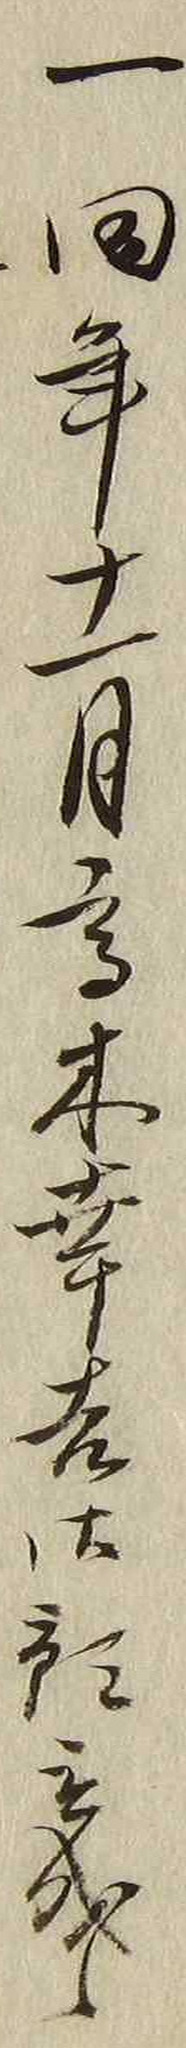一同年十一月高木幸吉御預被成候
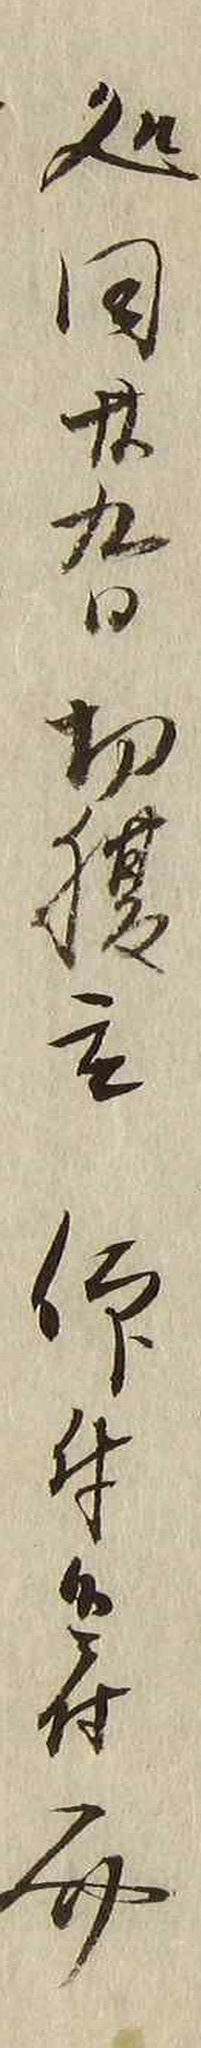処同廿九日切腹被仰付候ニ付介
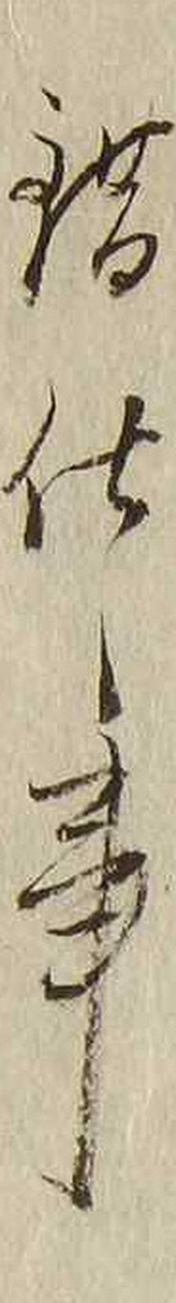錯仕候事

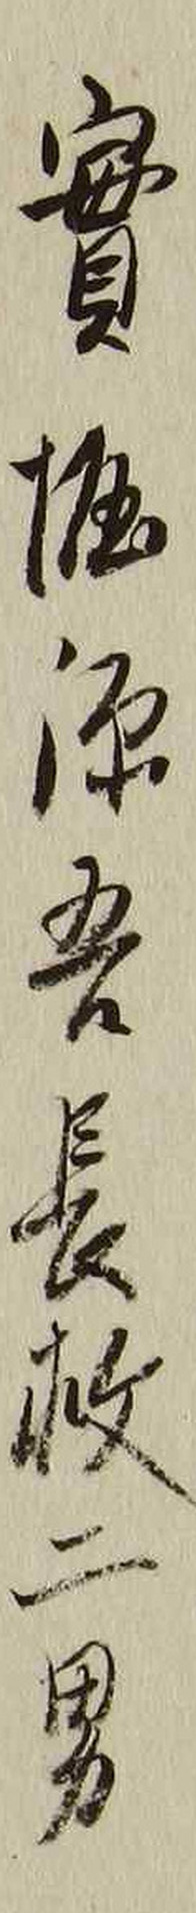実堀源吾長救二男
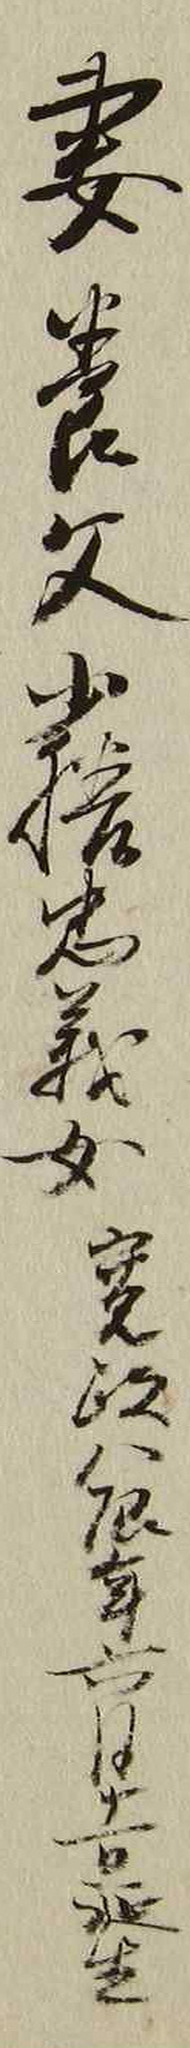妻養父少膳忠義女寛政八辰年六月十一日誕生
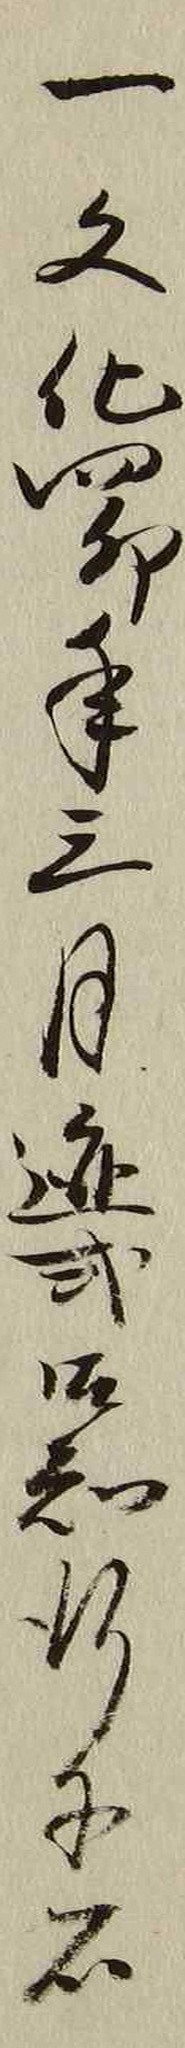一文化四卯年三月跡式御知行千石
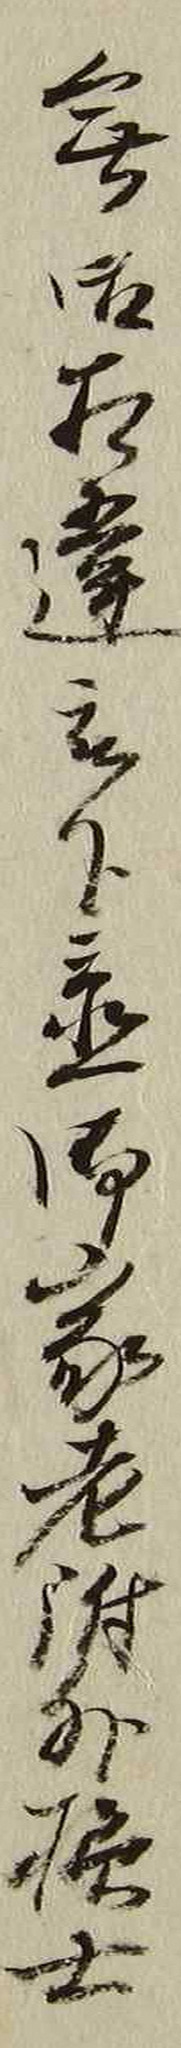無御相違被下置御家老附外様士
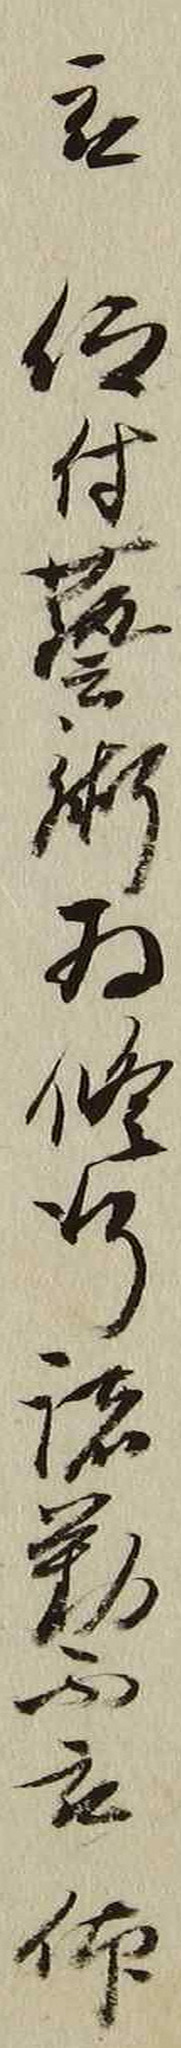被仰付芸術為修行諸勤不被仰
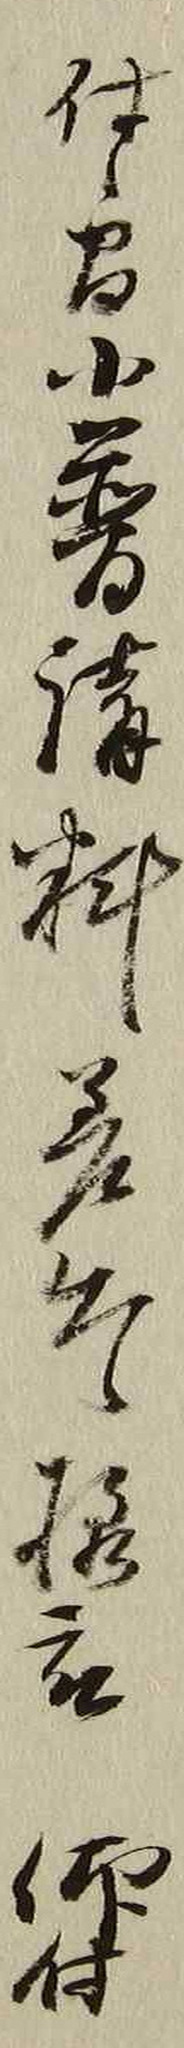付候間小普講料差出候様被仰付
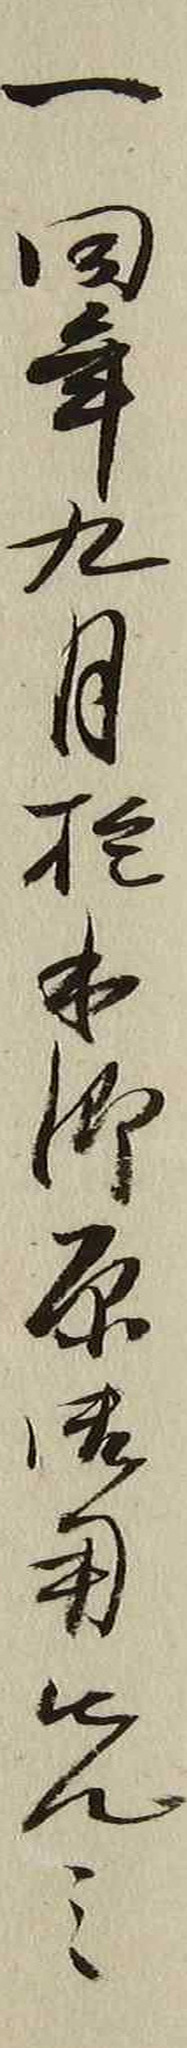一同年九月於本郷原御用先之
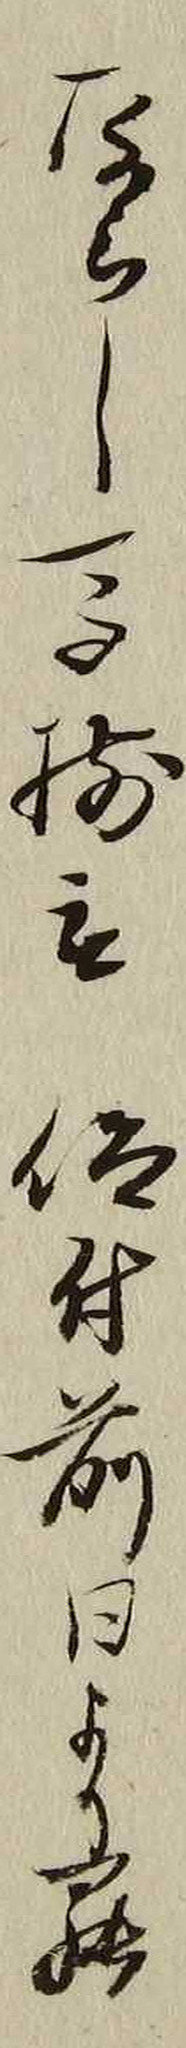ならし馬揃被仰付前日より罷
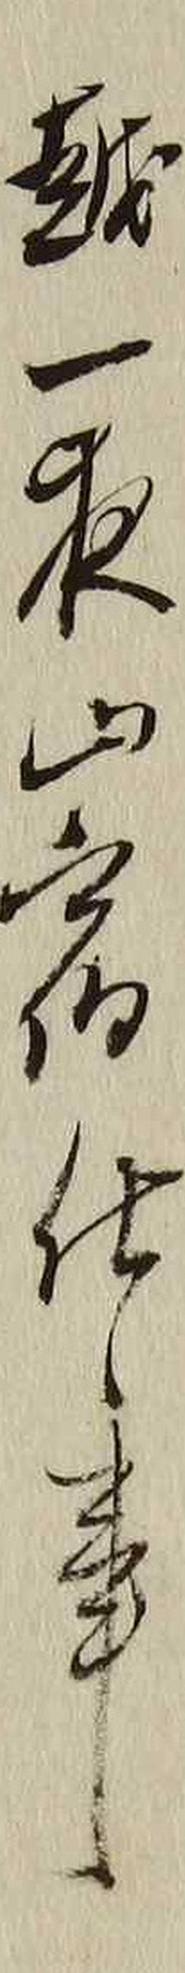越一夜山宿仕候事
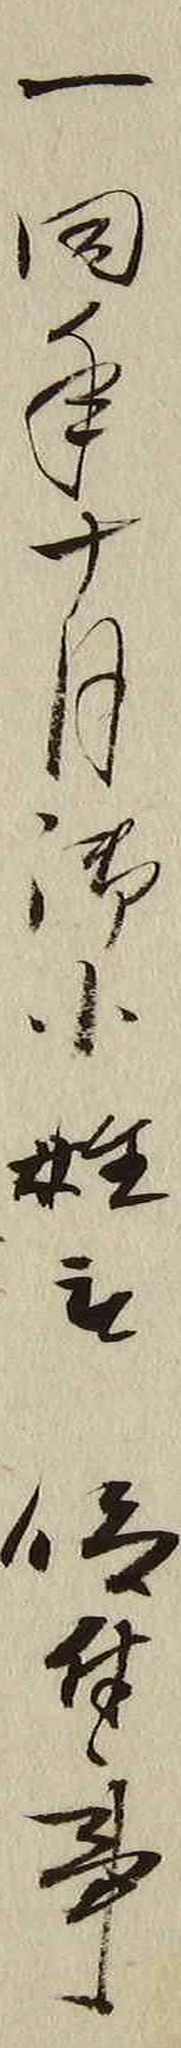一同年十月御小姓被仰付候事
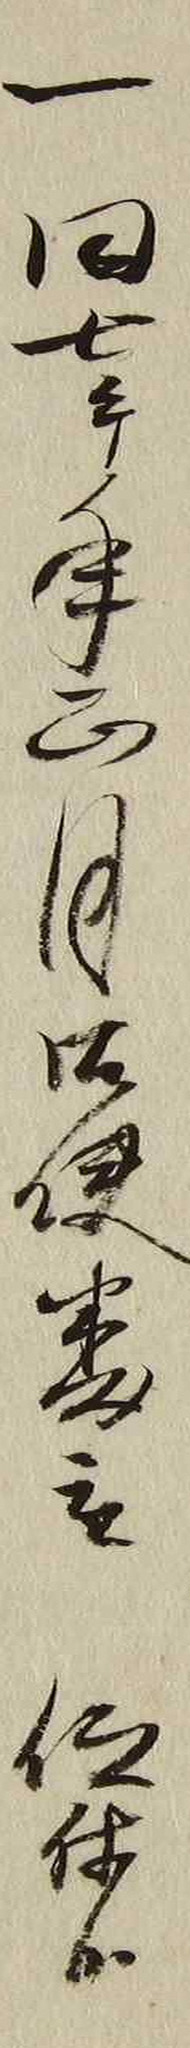一同七午年正月御使番被仰付候
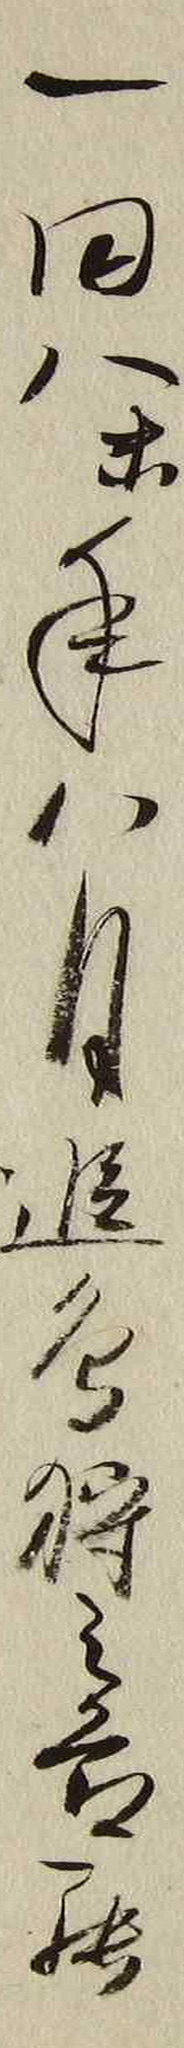一同八未年八月追鳥狩之節罷
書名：諸士系譜　巻之351　す之部1
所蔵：会津若松市立会津図書館
